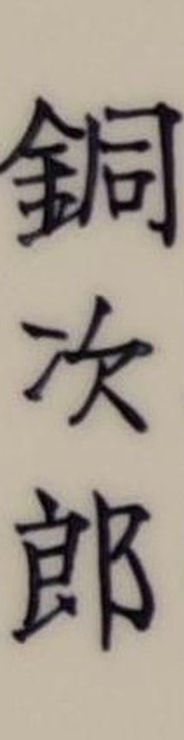銅次郎

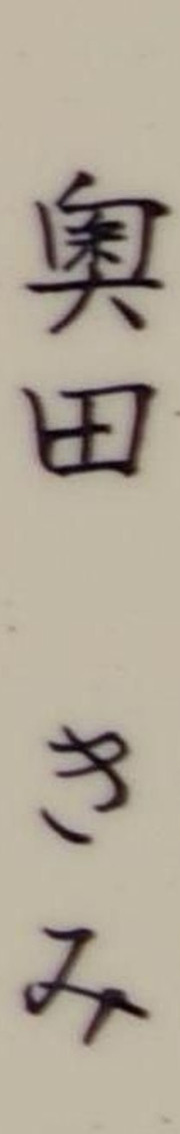奥田きみ
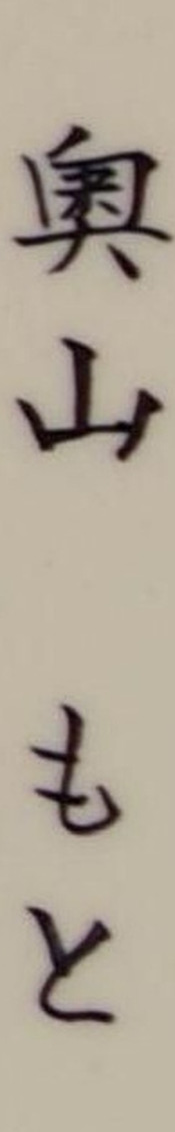奥山もと
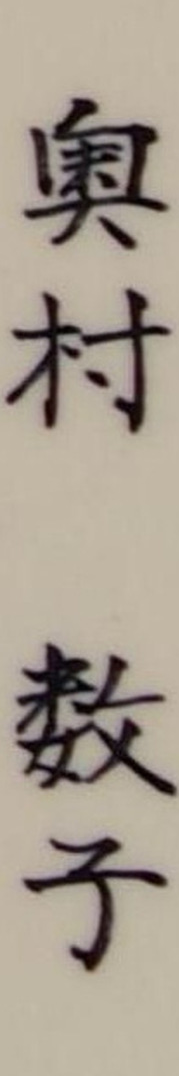奥村数子
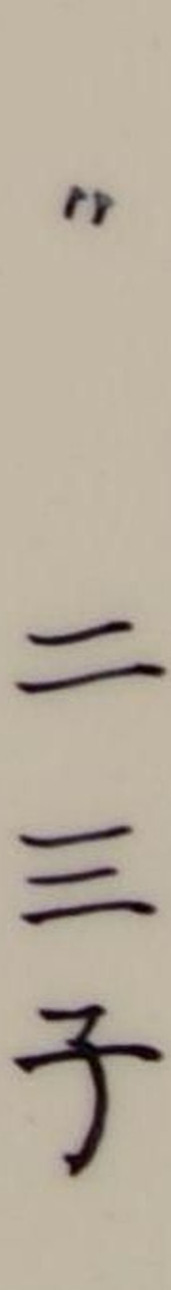二三子
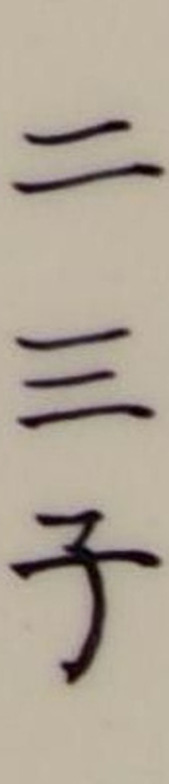二三子
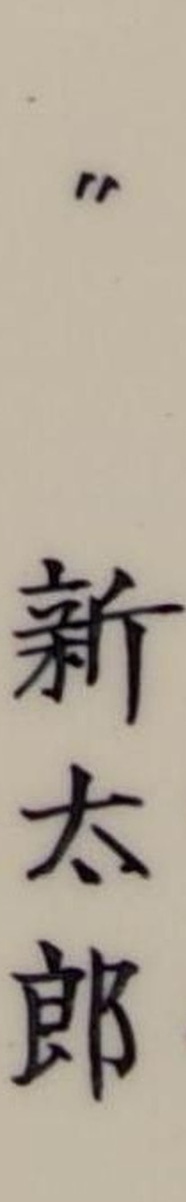新太郎
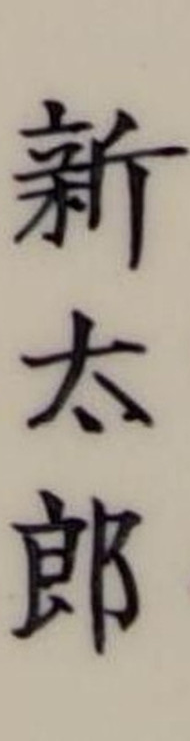新太郎
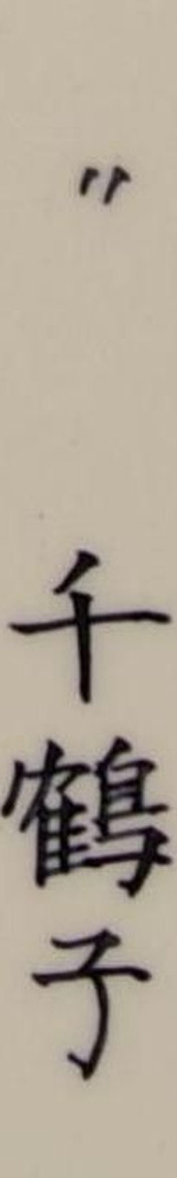千鶴子
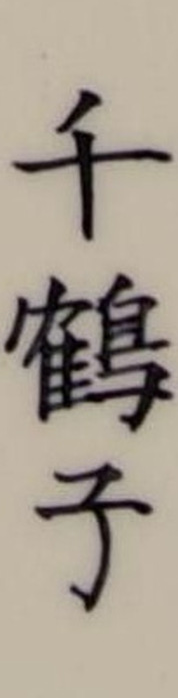千鶴子
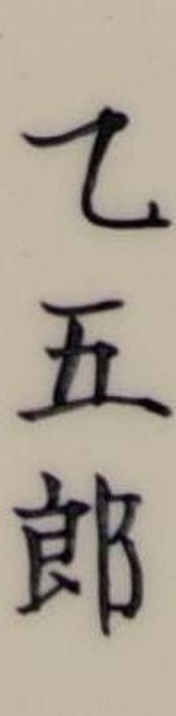乙五郎
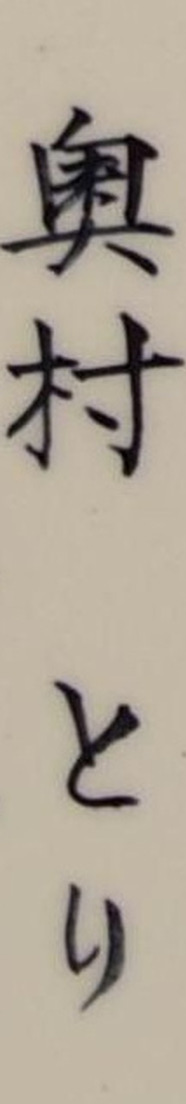奥村とり
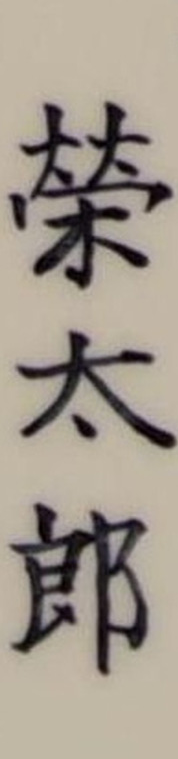榮太郎
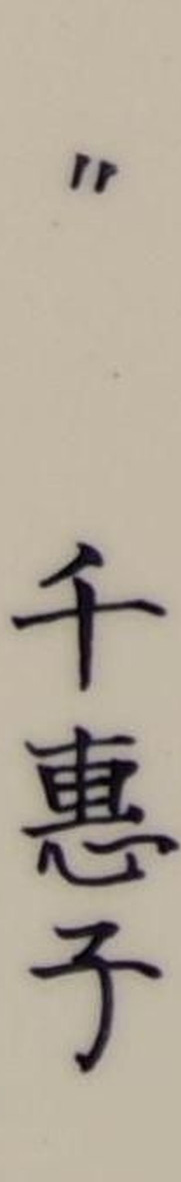千鶴子
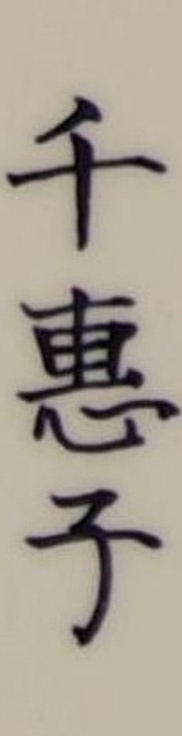千鶴子
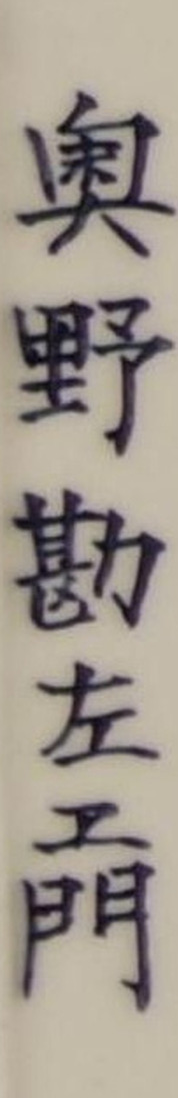奥野勘左エ門
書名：E~L
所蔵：高野山金剛峯寺
